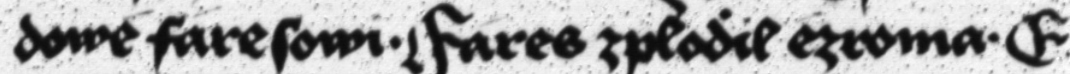dowé fareſowi. Fáres zploḋil ézroma, E
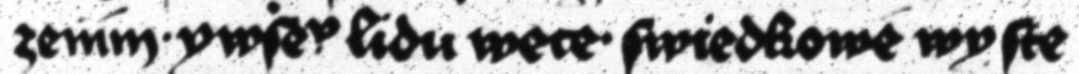zením. ywẛev lidu wece. ſwiedkowé wy ſte
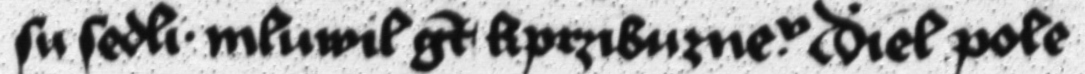ſu ſedli. mluwil ḡt k przibuznev Ḋíel pole
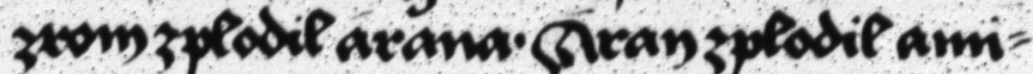zrom zplodil árana. Áran zplodil ami
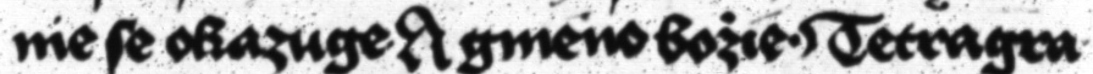nie ſe okazuge A gméno bożíe Tetragra
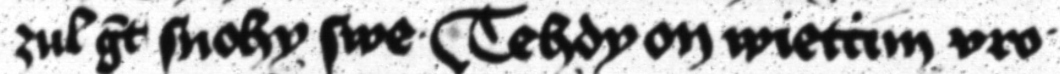zul ḡt ſnohy ſwe. Tehdy on wietċím vro
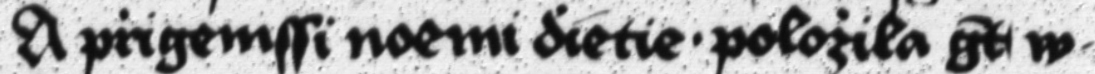A pṙigemſſi noemi ḋíetie. polożila ḡt w
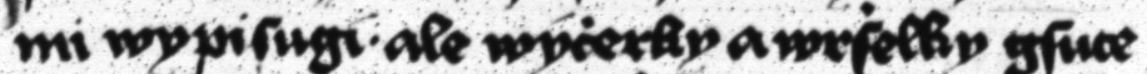mi wypiſugí. ale wýċerky a wrẛelky gſuce
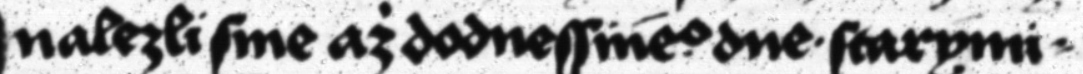nalezli ſme aż dodneſſníe° dne ſtarými
